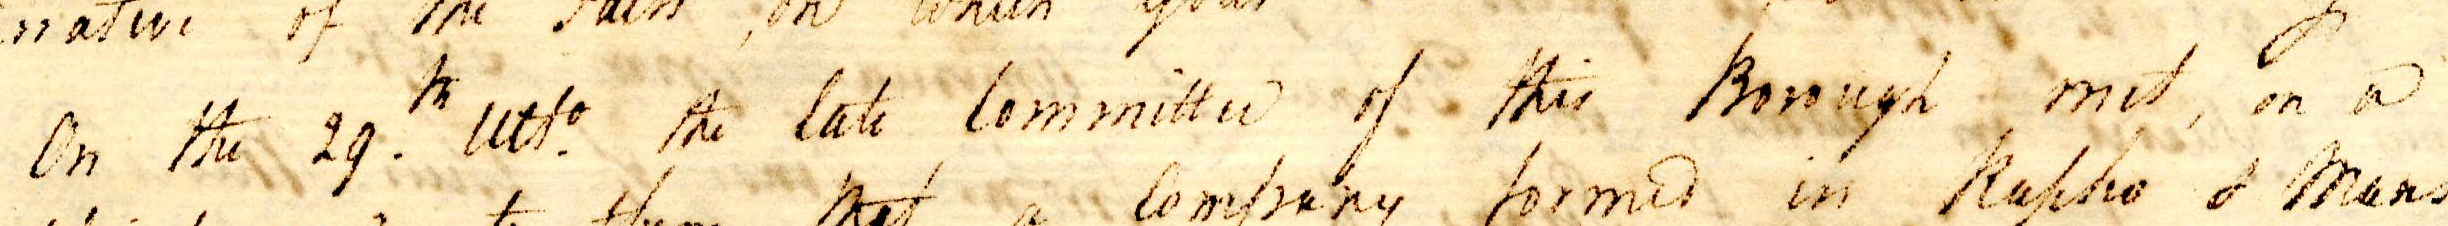On the 29^th. Ult^o. the late Committee of this Borough met on a
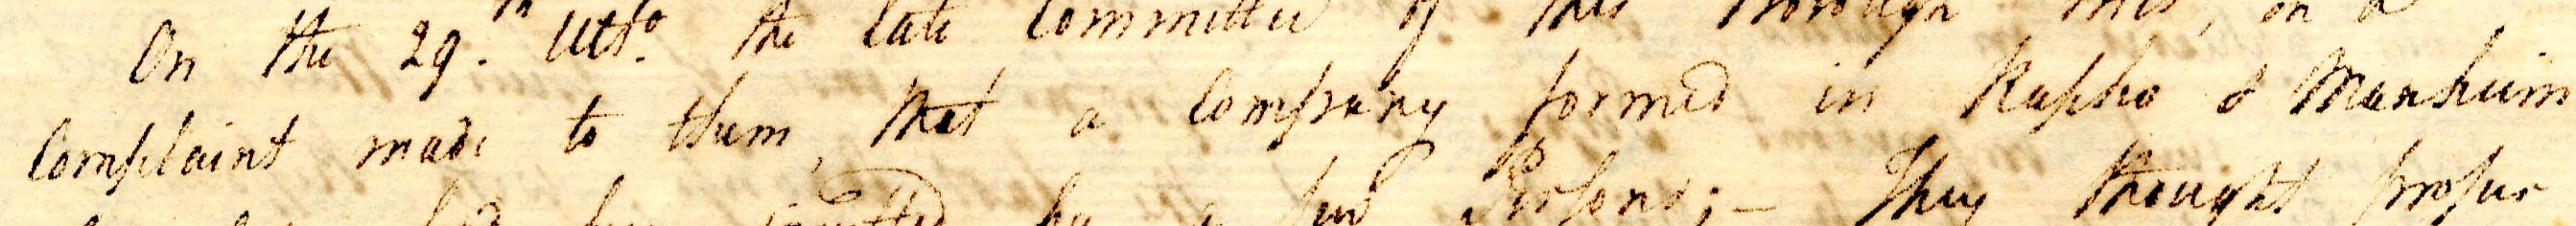Complaint made to them that a company formed in Rapho & Manheim
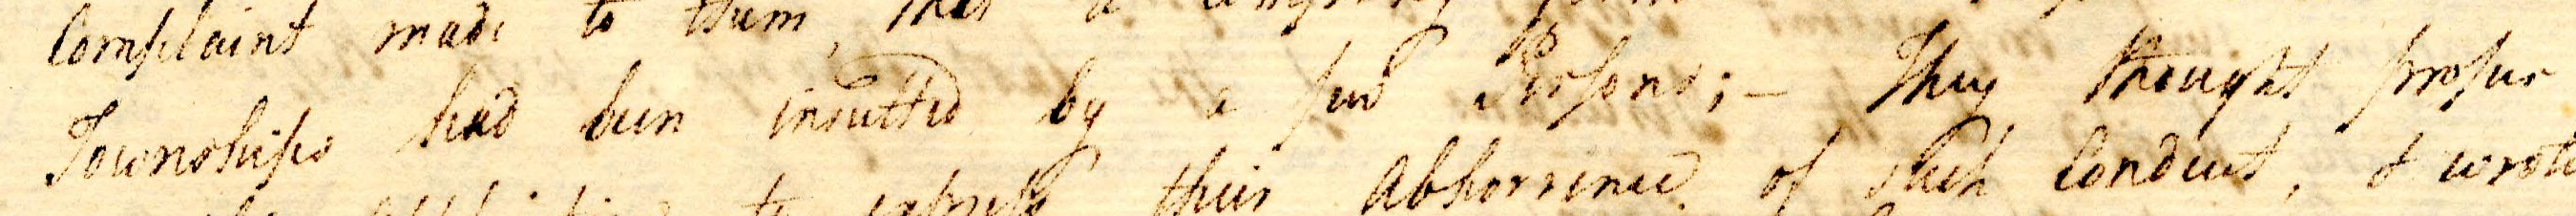Townships had been insulted by a few Persons; They thought proper
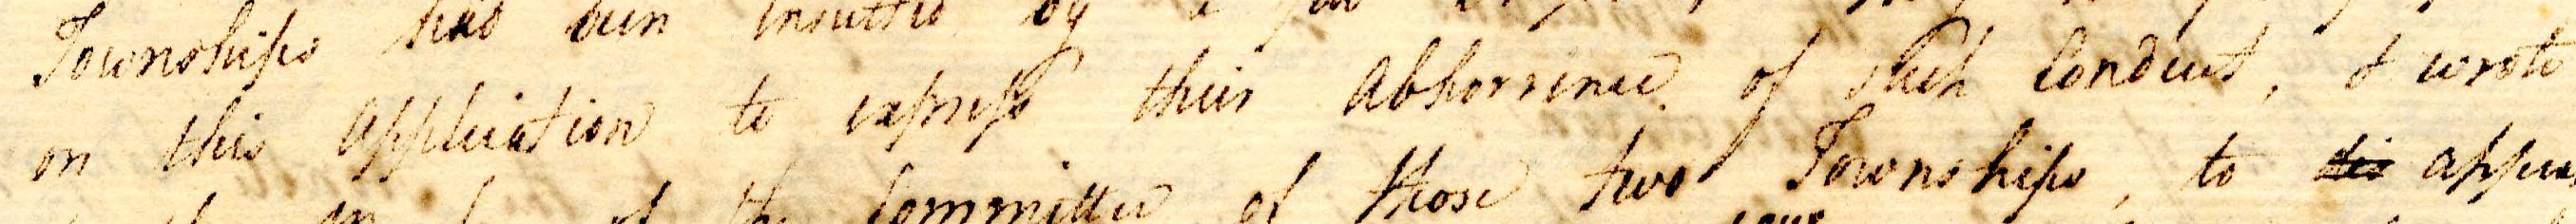on this Application to express their abhorrence of such Conduct, & wrote
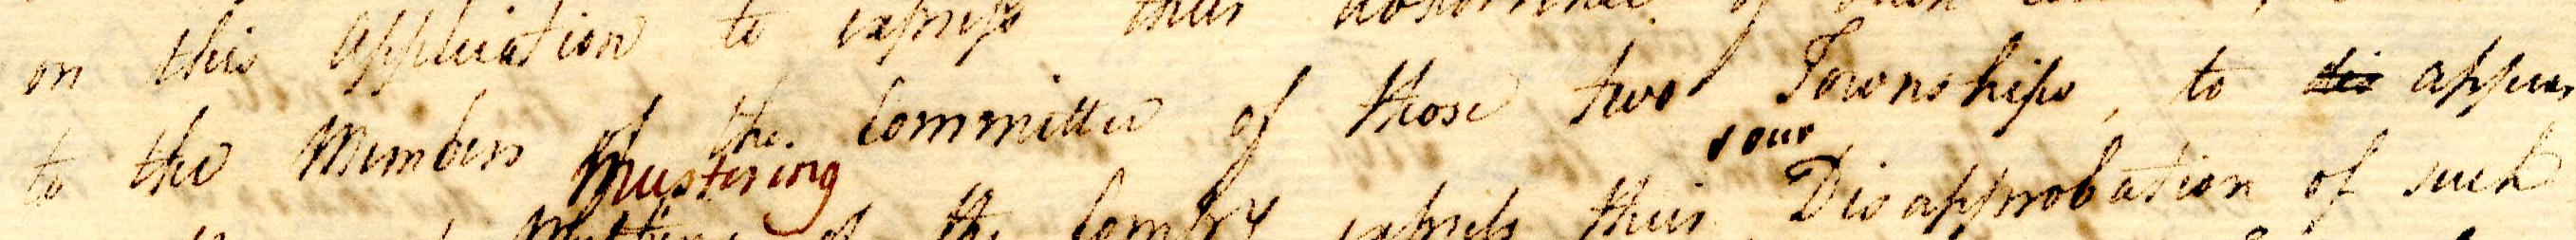to the Members of the Committee of those two Townships, to dis appear
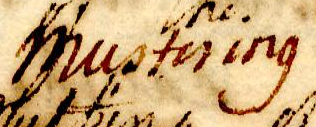Mustering
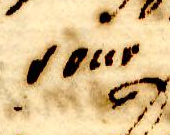sour
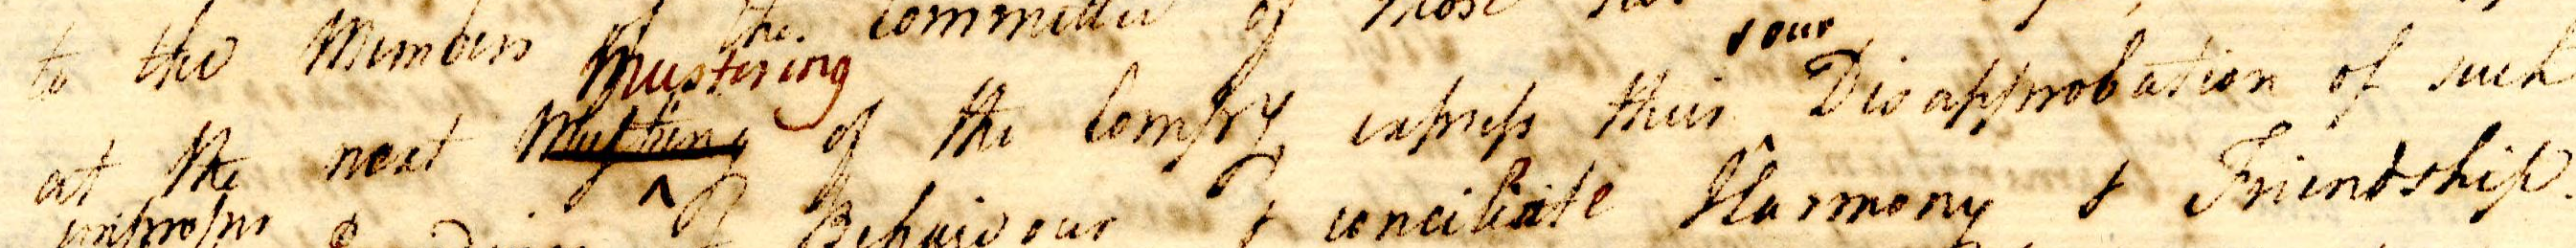at the next Meeting ^ of the Company, express their ^ Disapprobation of such
